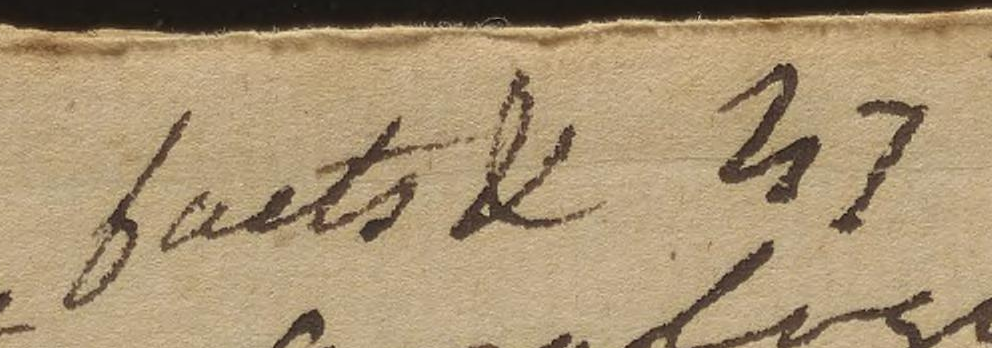facts & 47
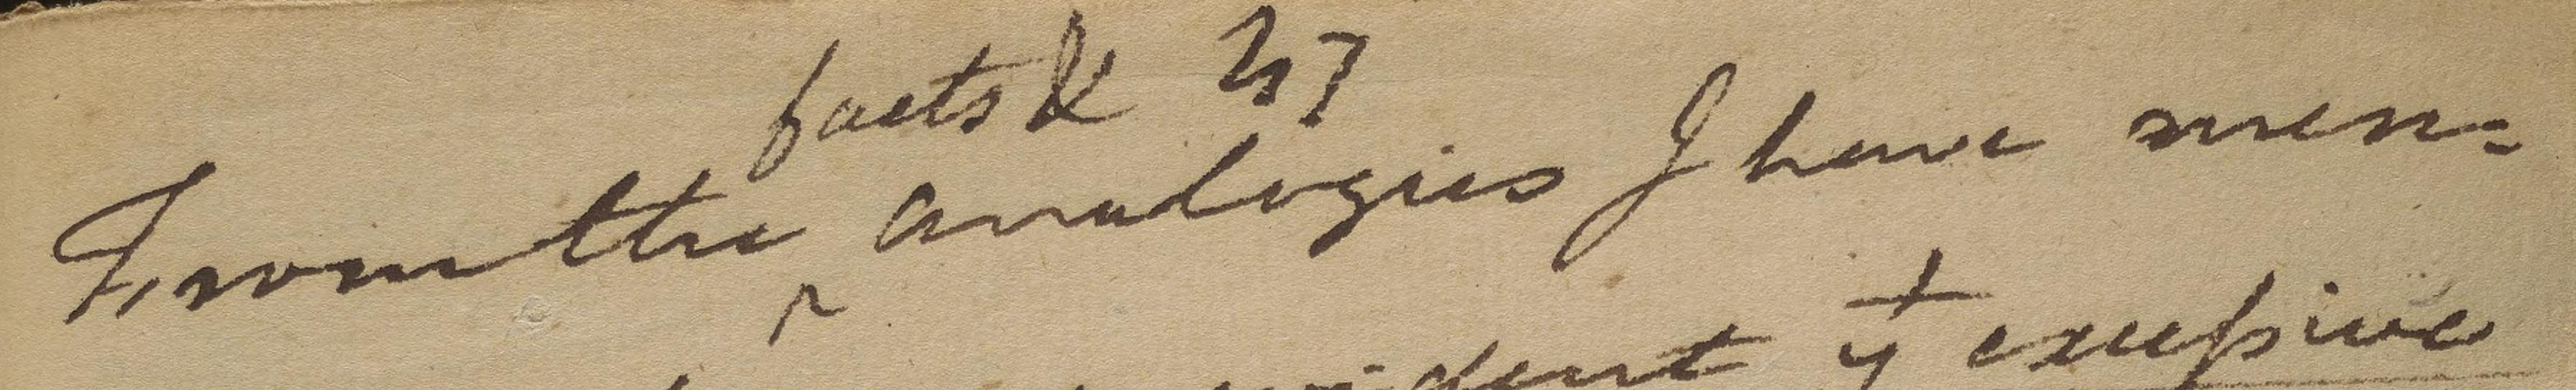From the ^ analogies I have men-
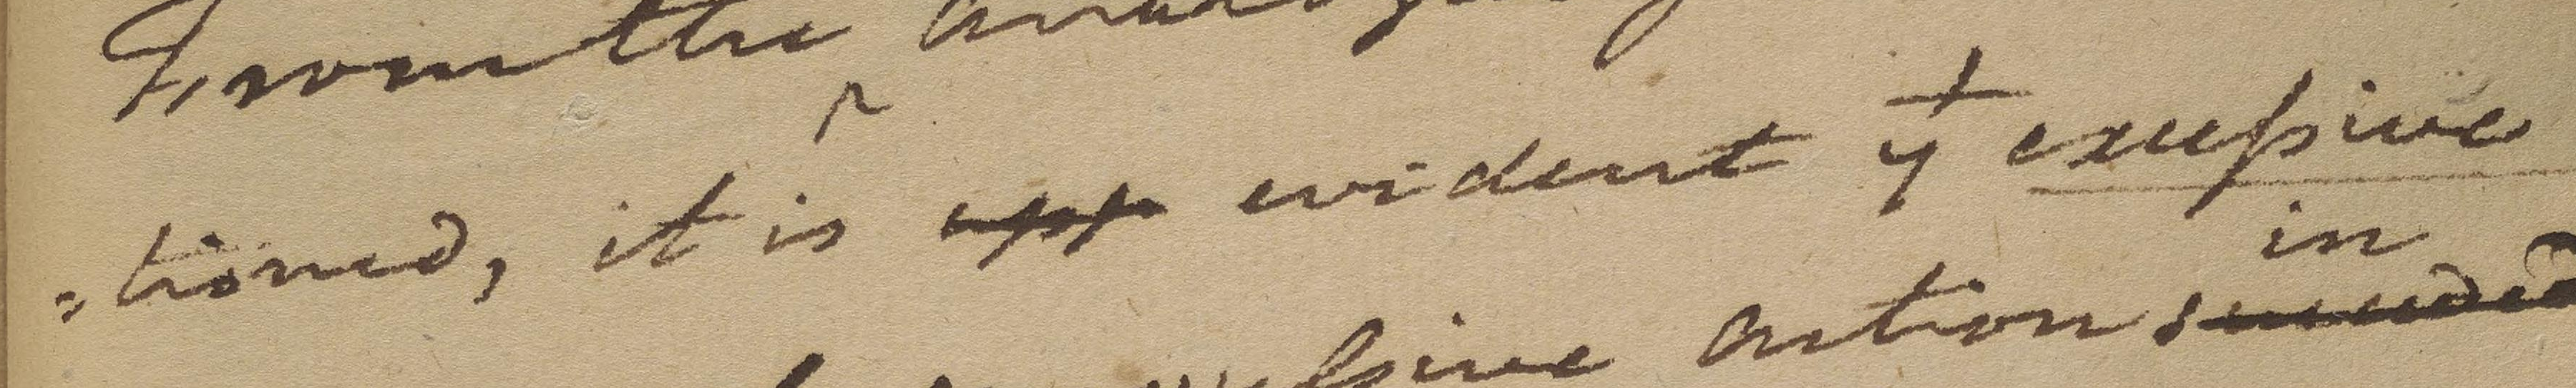-tioned, it is [app] evident y^t excessive
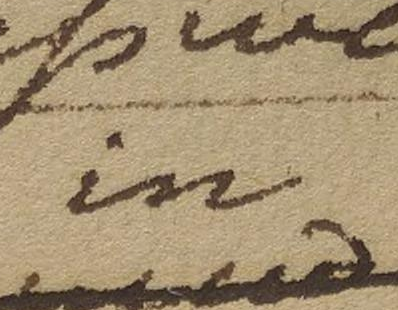in
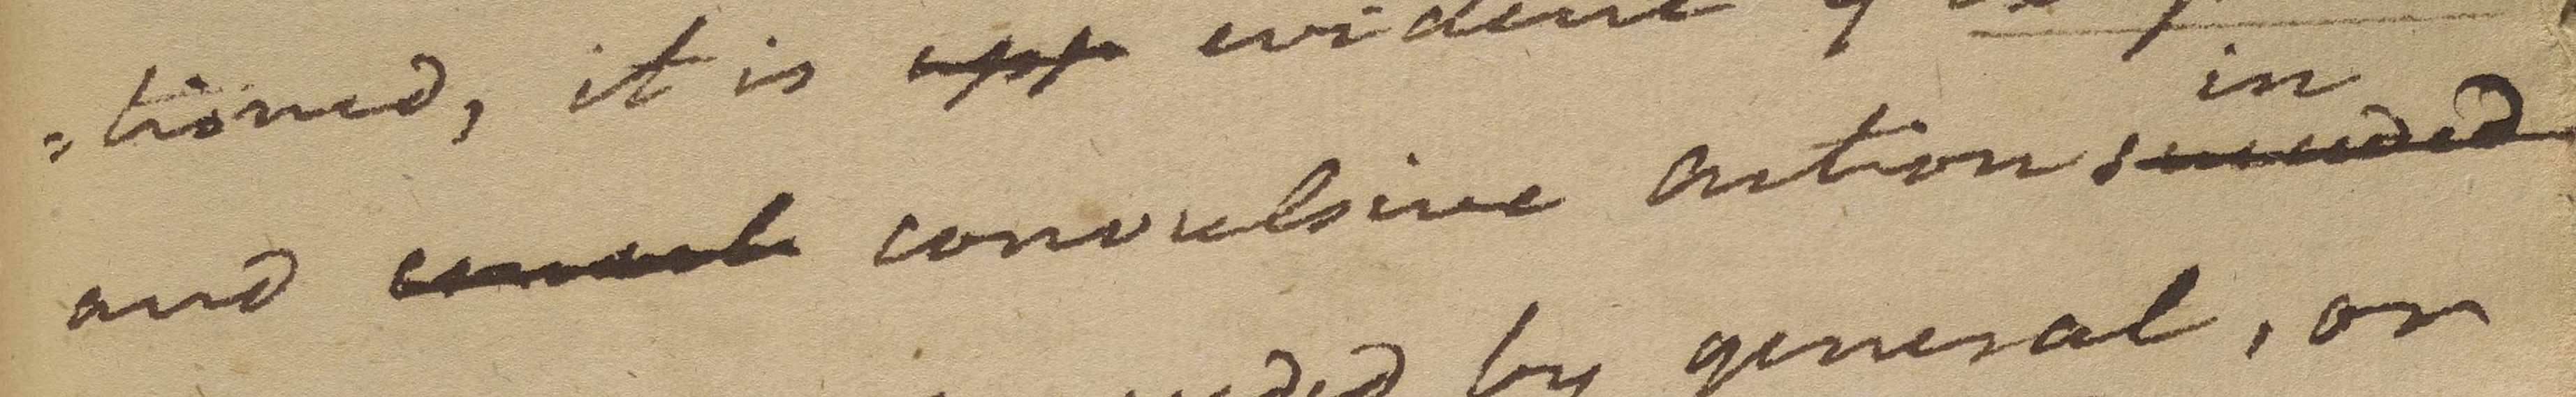and [convuk] convulsive action [succeded]
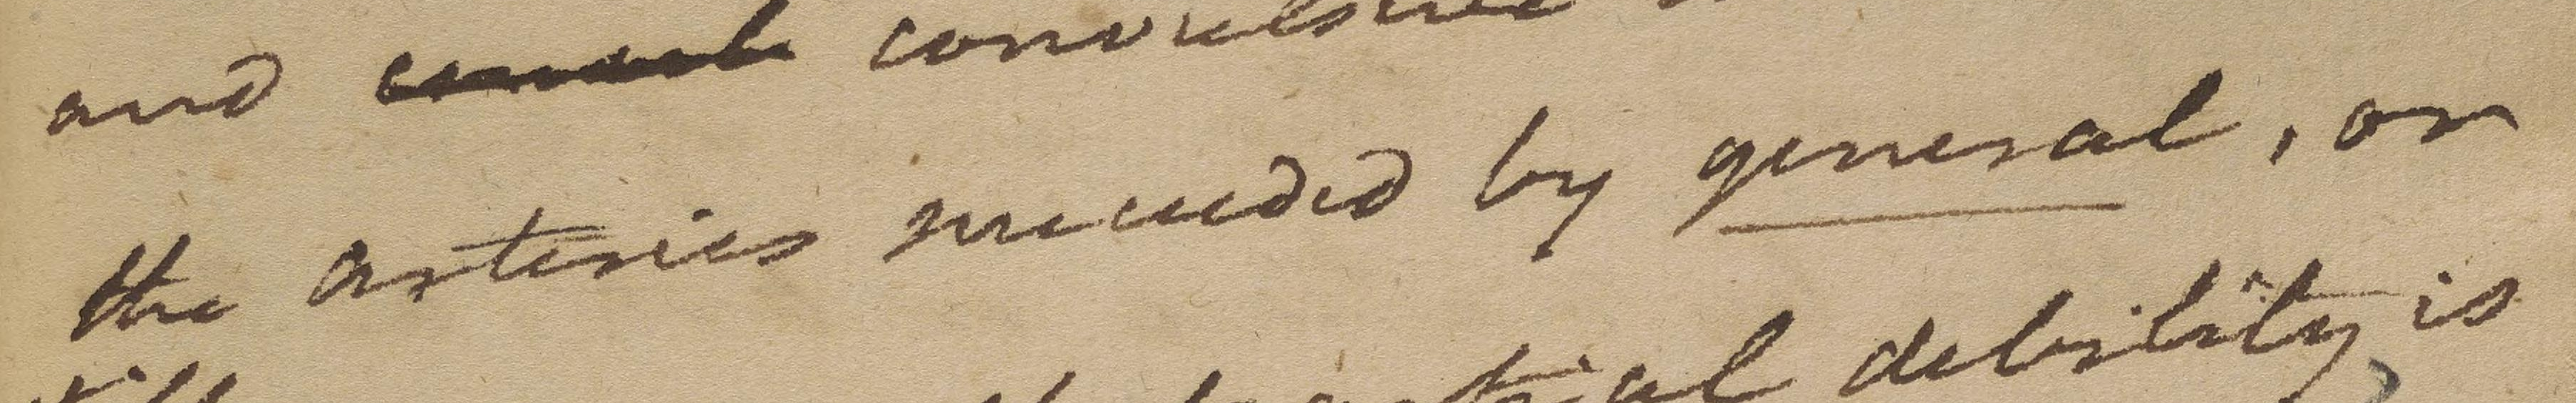the arteries preceded by general, or
